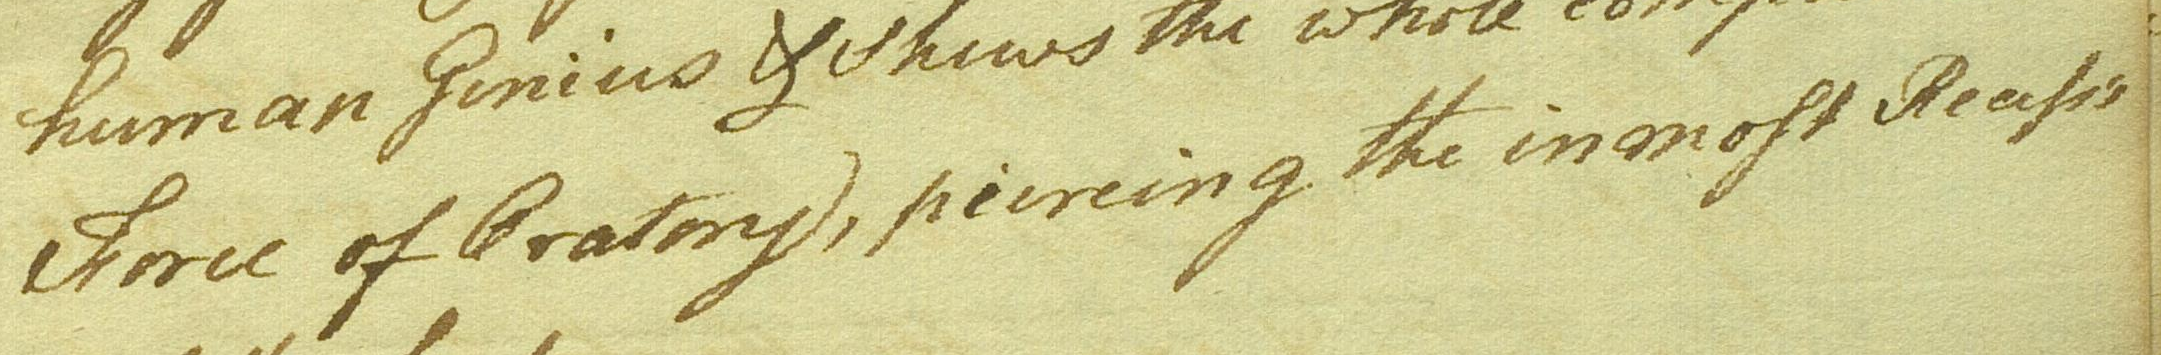Force of Oratory, piercing the inmost Recesses
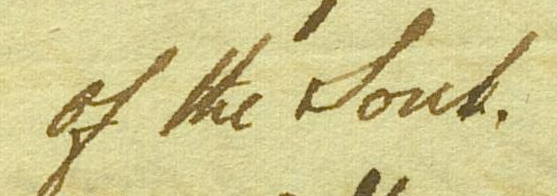of the Soul.
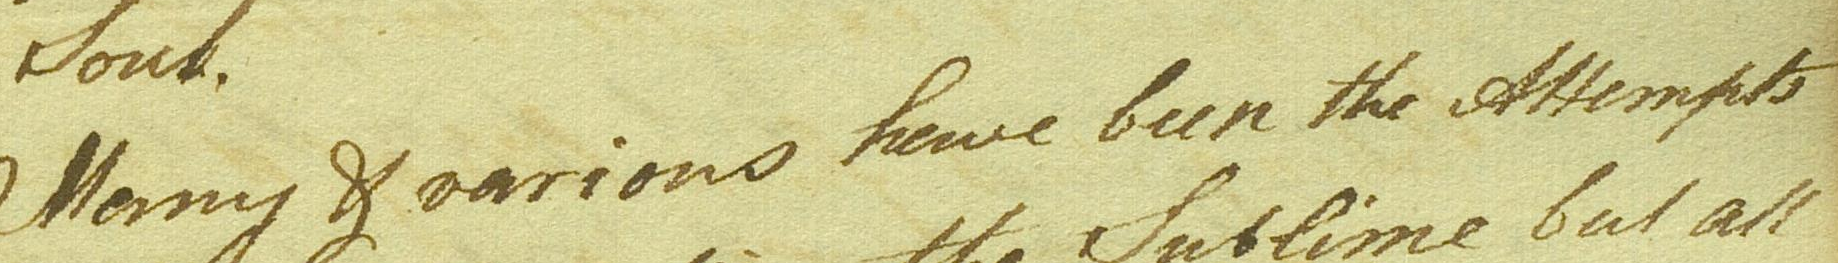Many & various have been the Attempts
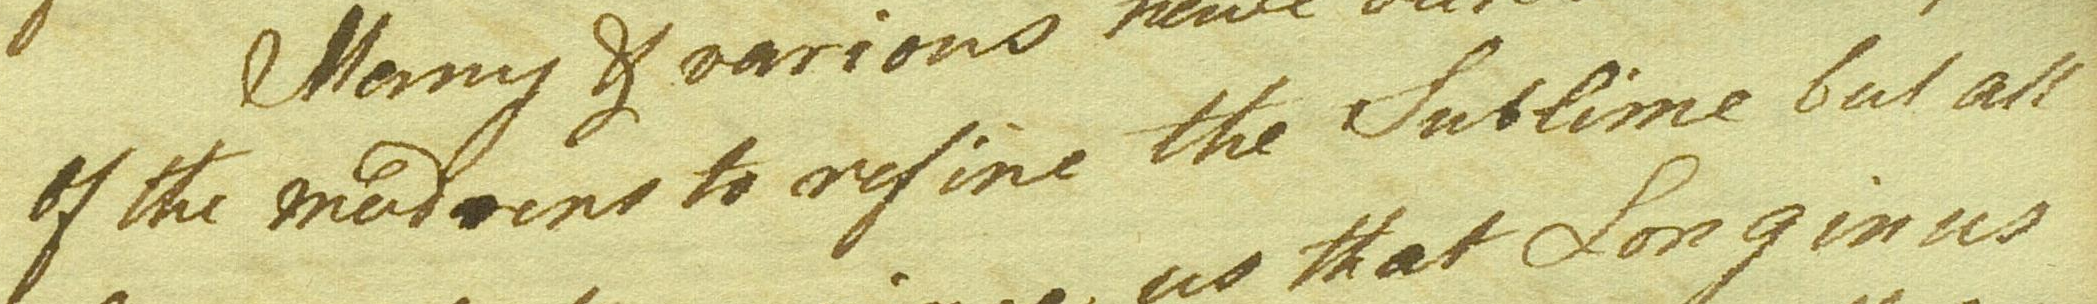of the madins to refine the Sublime but all
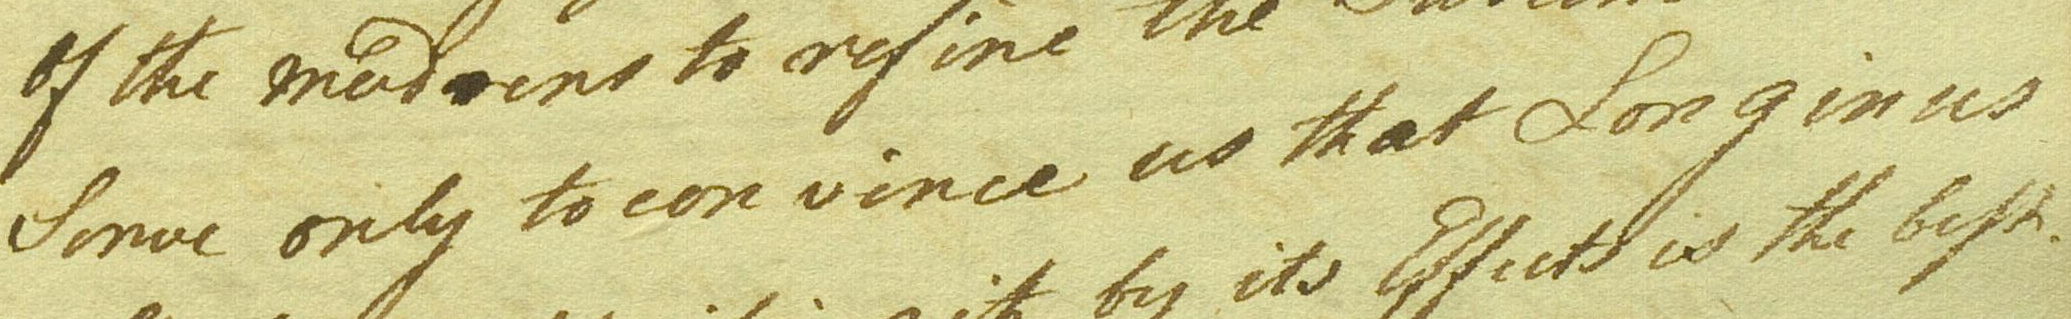serve only to convince us that Longinus
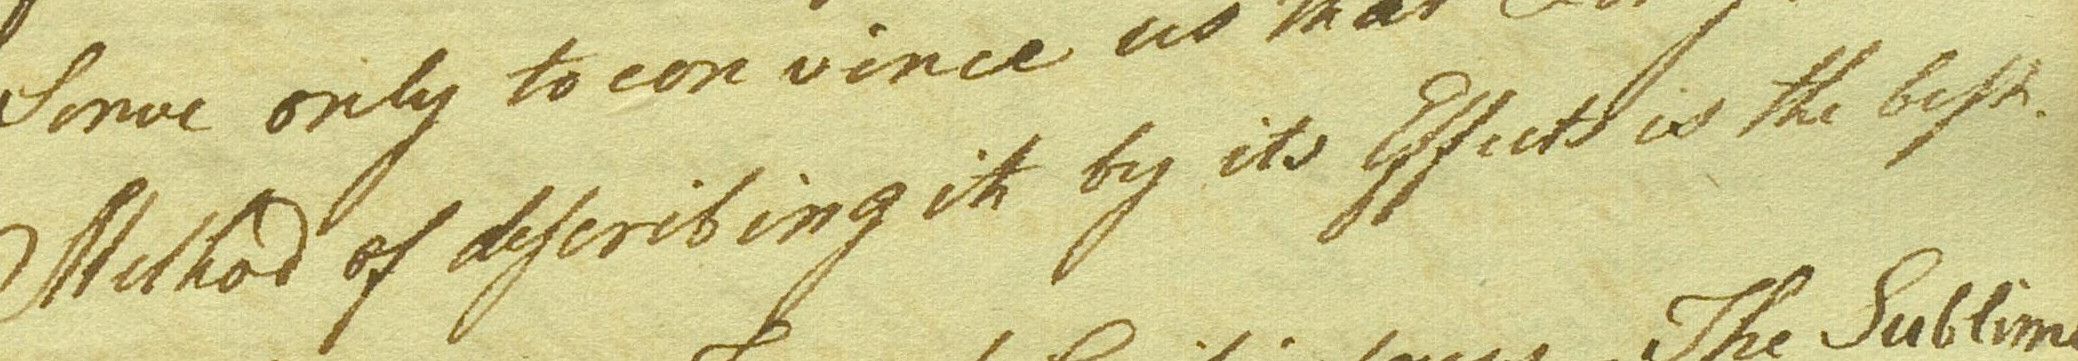Method of describing it by its Effects is the best.
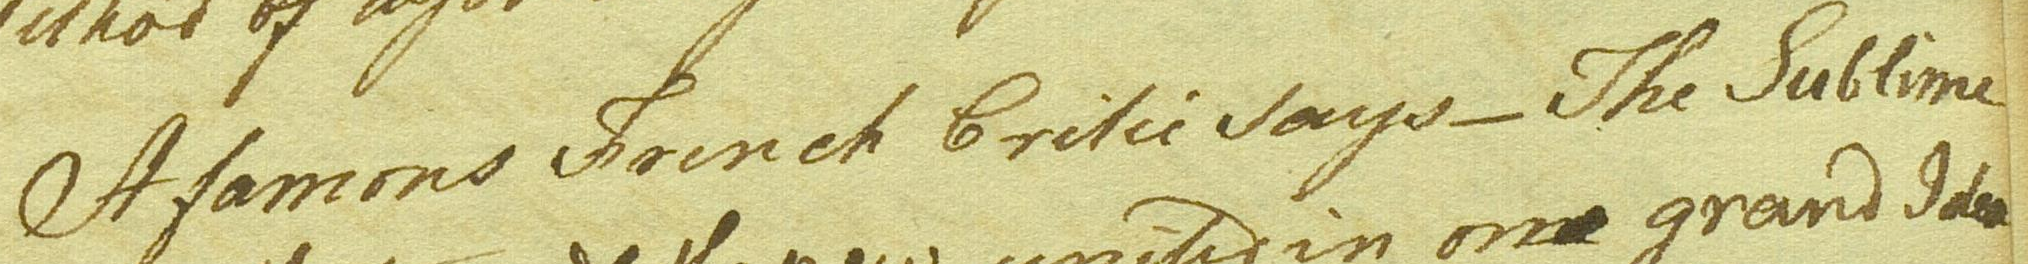A famous French Critic says– The Sublime
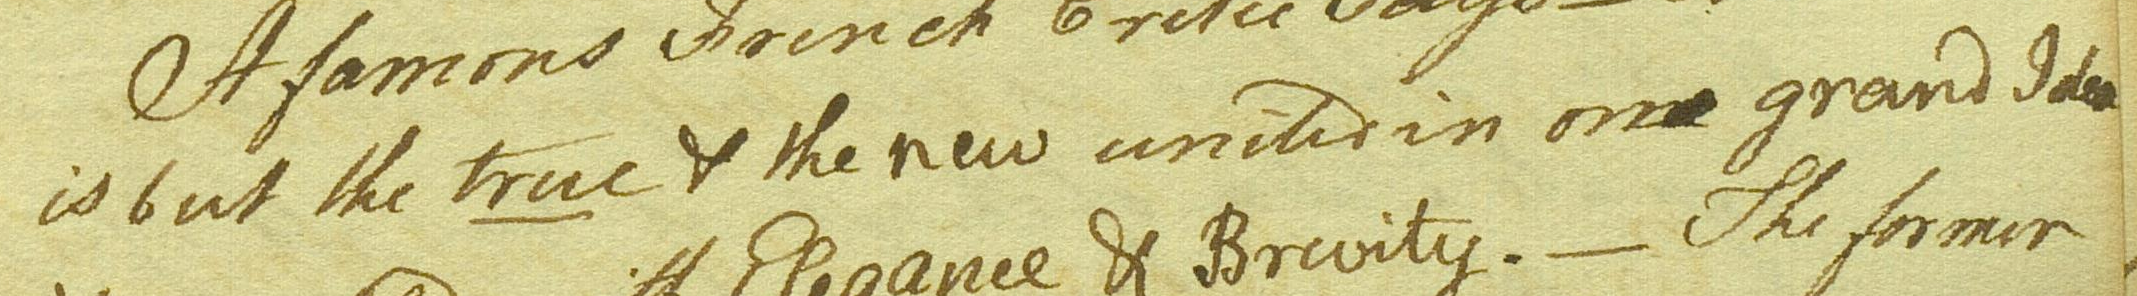is but the true & the new united in one grand Idea
